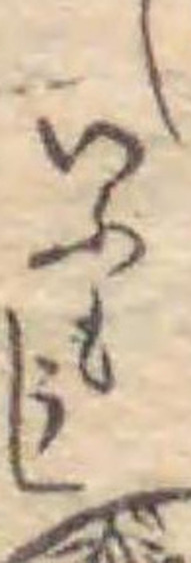いふもうし
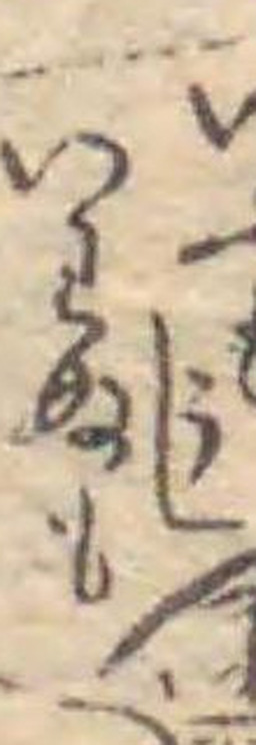いわぬも
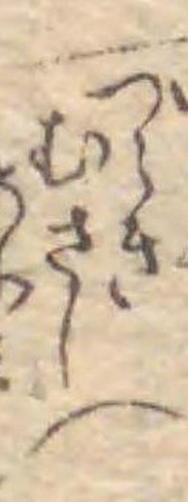むさし
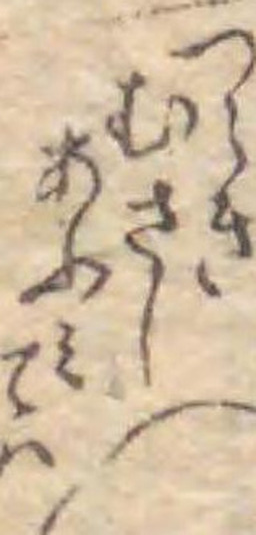あふみては
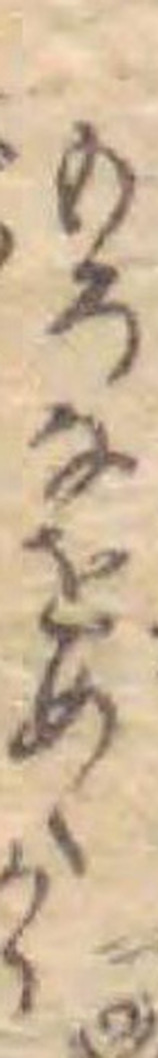もろなをめゝから
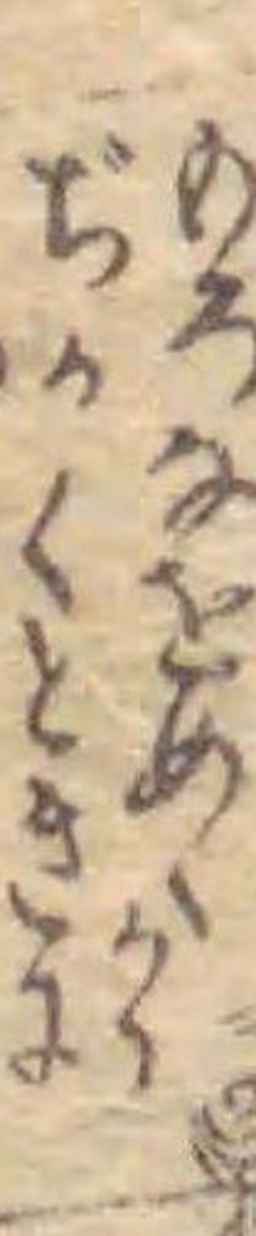ぢかくときに
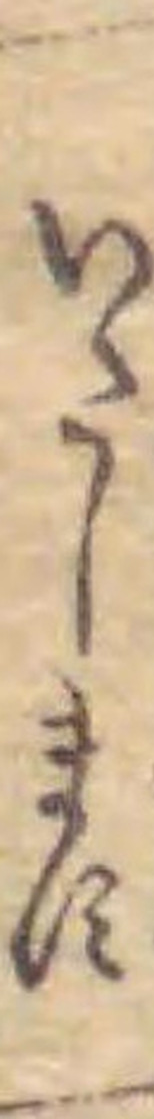いたします
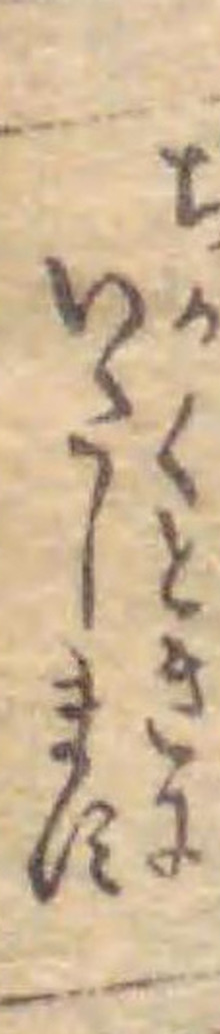いたします

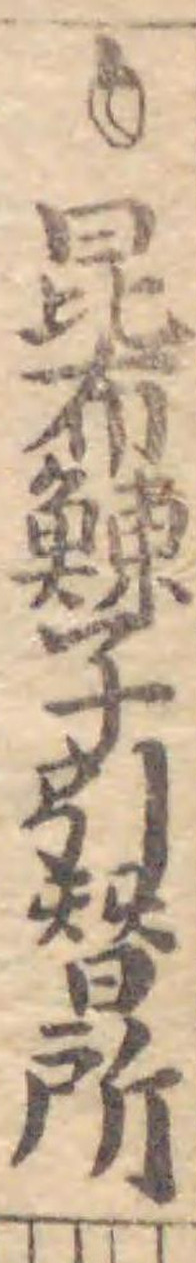昆布鯟子引替所
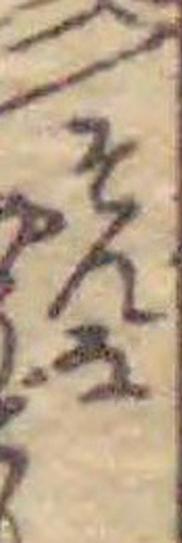そんな
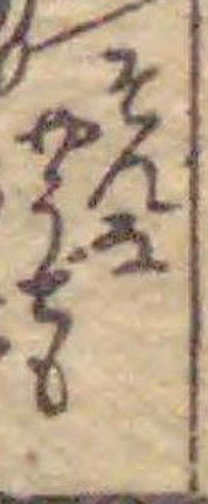やうでも
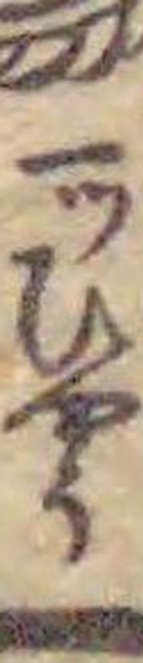一ッひやう
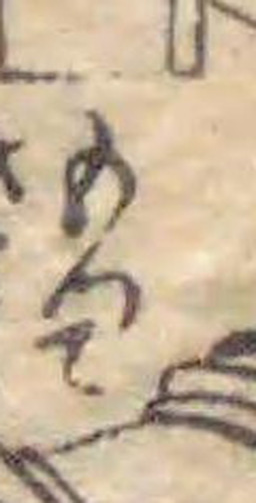もつて
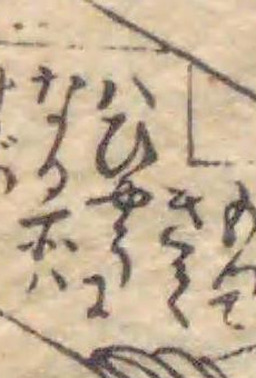なる所は
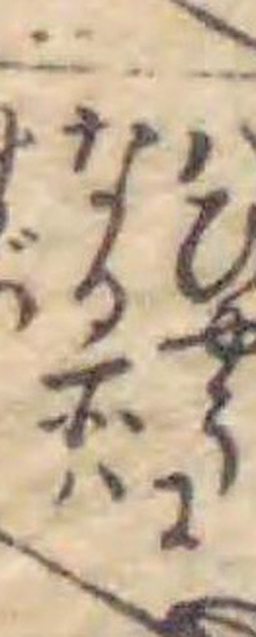なる所は
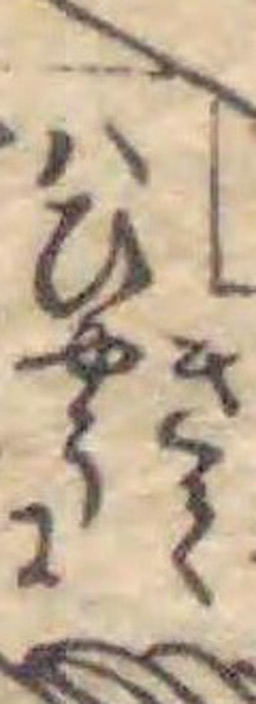八ひやうに
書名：悦贔負蝦夷押領 : 3巻
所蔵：国立国会図書館 National Diet Library, JAPAN
